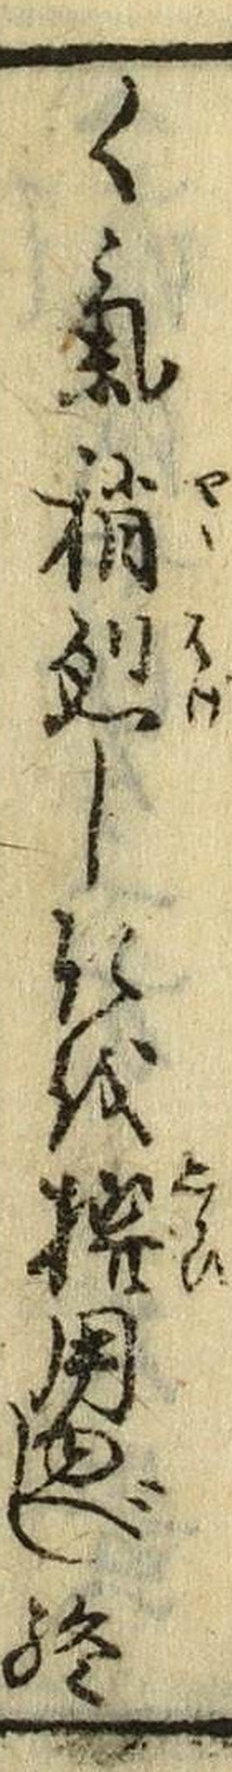く気稍烈しきを撰用ゆべし終
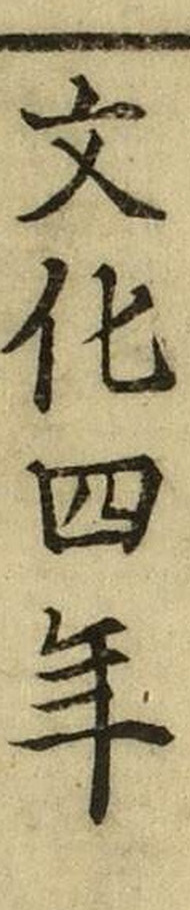文化四年
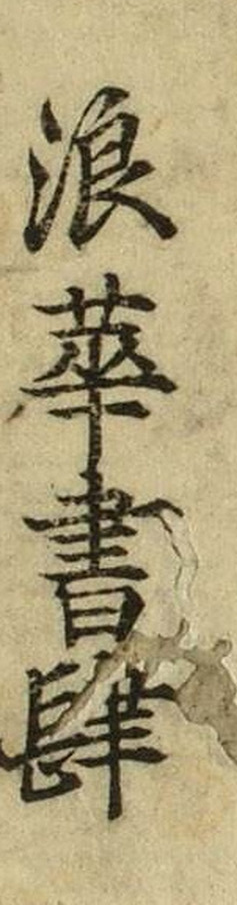浪華書肆
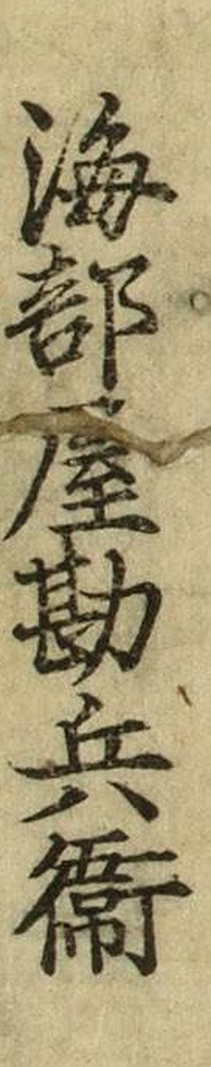海部屋勘兵衛
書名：居家養生記
